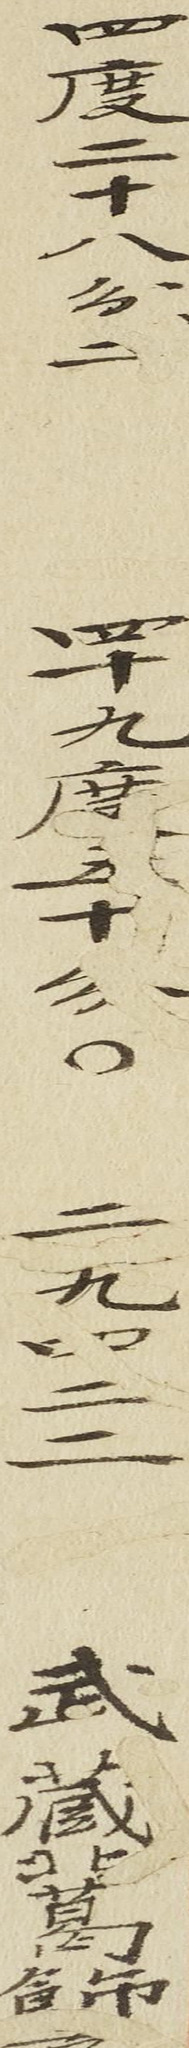四度二十八分、二四十九度五十分、九二、九四二二武蔵北葛飾幸手
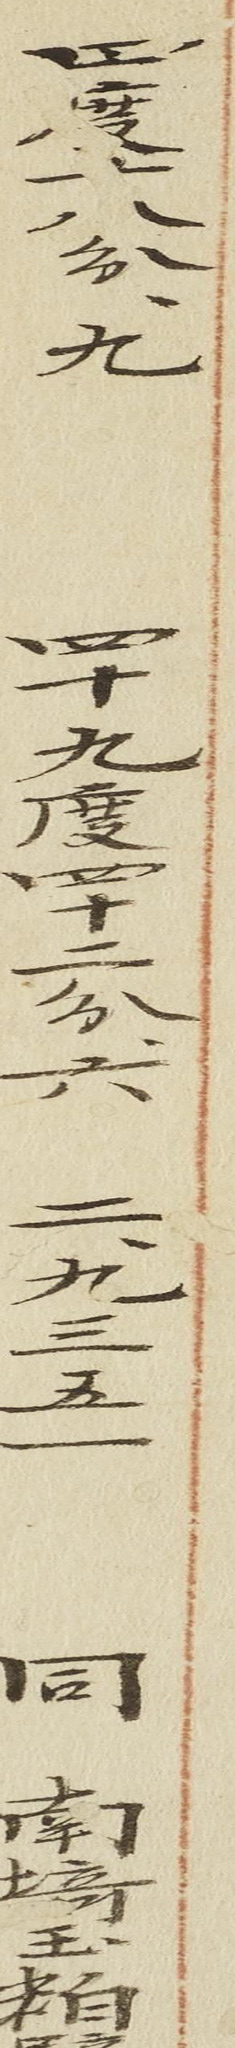四度十八分、九四十九度四十二分、六二、九三五一同南埼玉粕壁
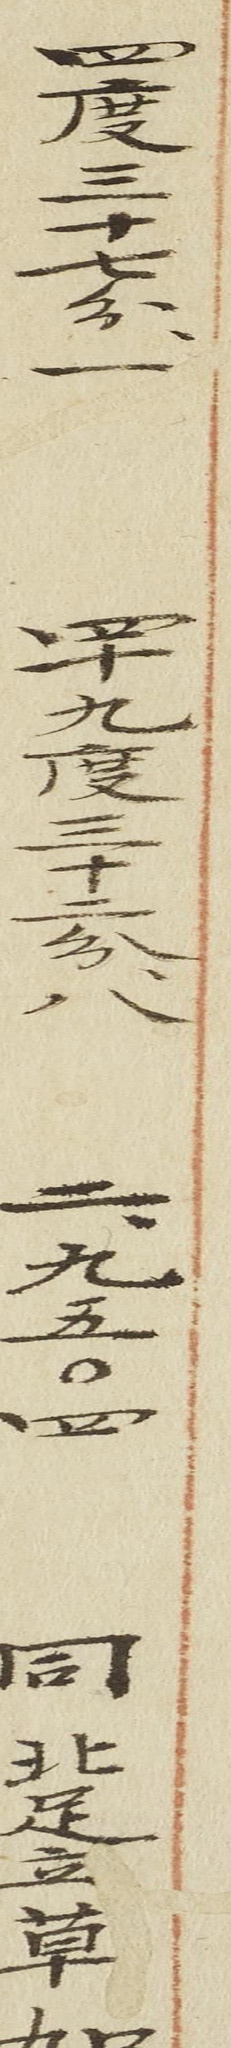四度三十七分、一四十九度三十二分、八二、九五〇四同北足立草加
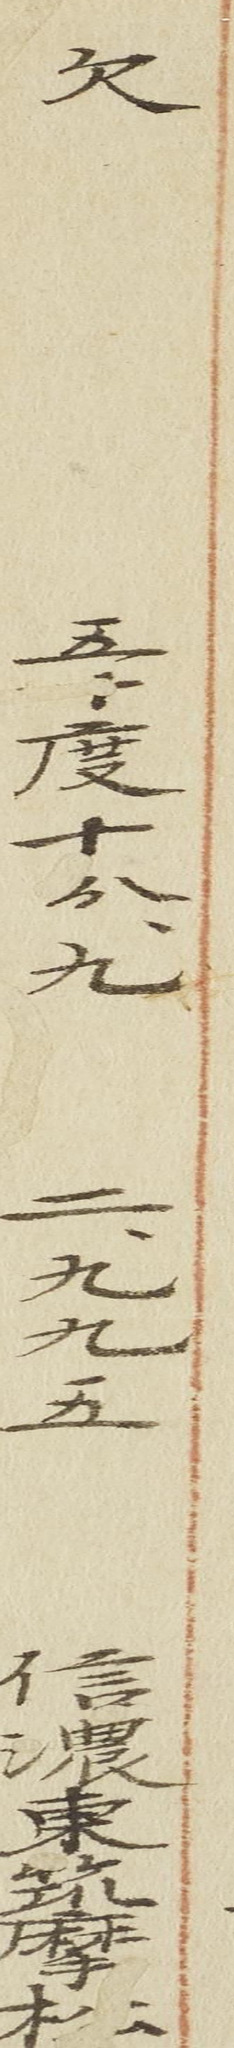欠五十度十分、九二、九九五信濃東筑摩松本
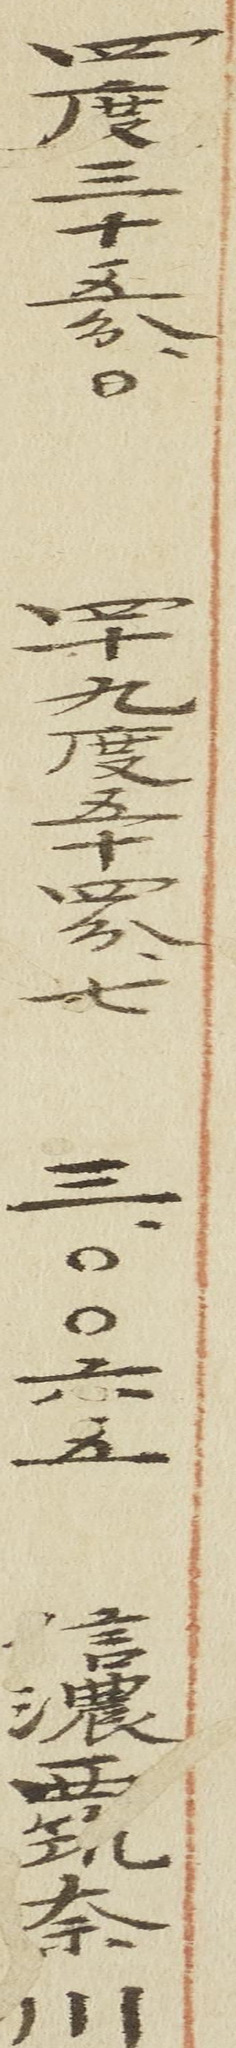四度三十五分、〇四十九度五十四分、七三、〇〇六五信濃西筑奈川
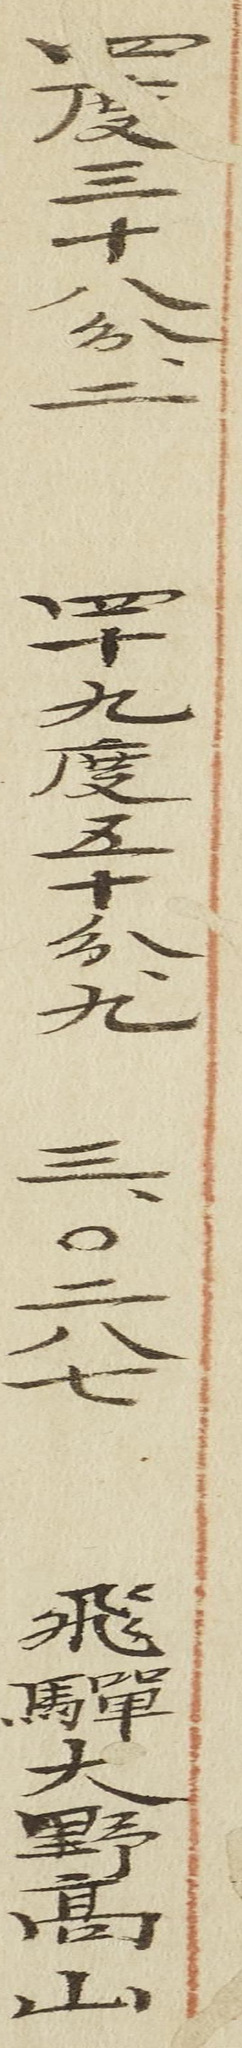四度三十八分、二四十九度五十分、九三、〇二八七飛騨大野髙山
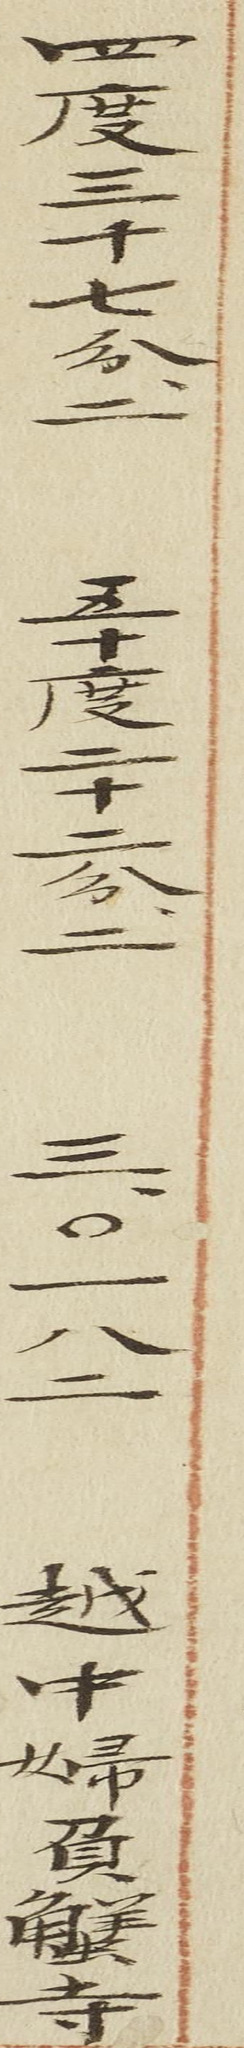四度三十七分、二五十度二十二分、二三、〇一八二越中婦負蟹寺
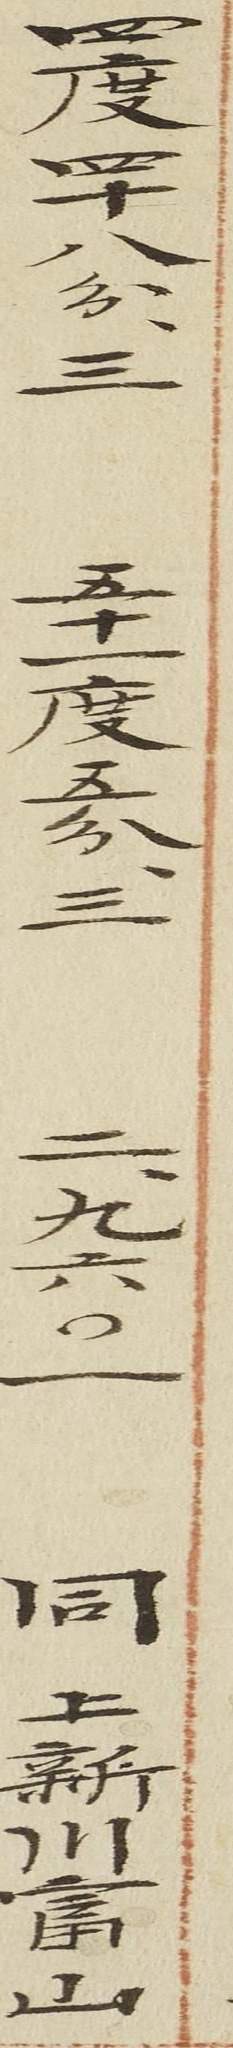四度四十八分、三五十一度五分、三二、九六〇一同上新川富山
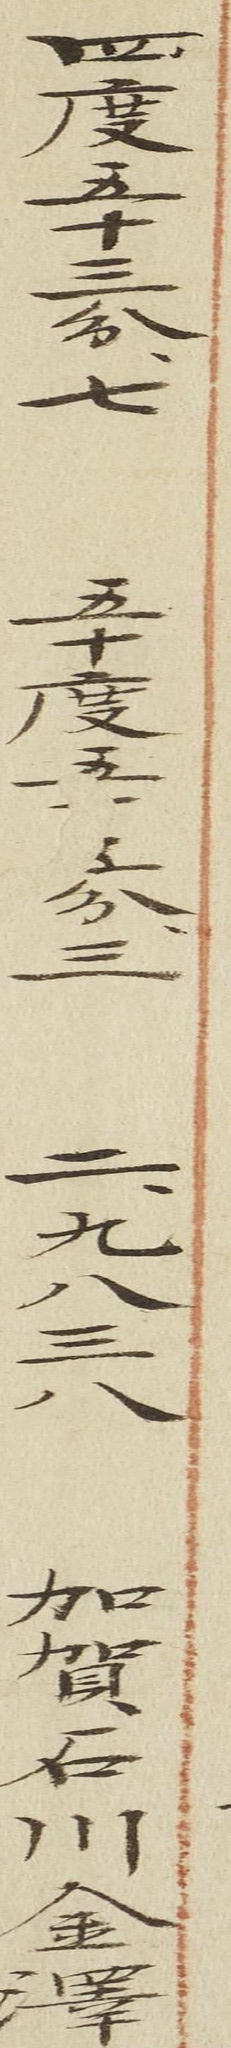四度五十三分、七五十度五十五分、三二、九八三八加賀石川金沢
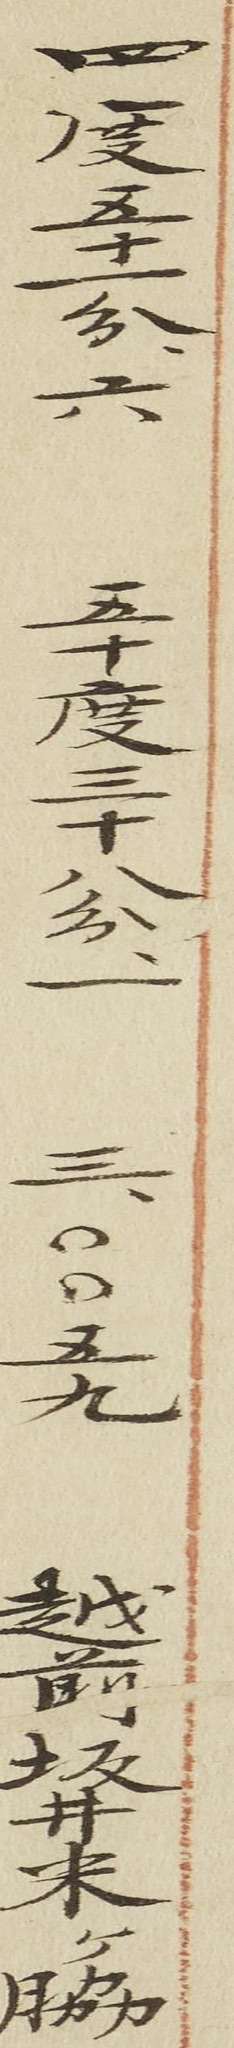四度五十一分、六五十度三十八分、一三、〇〇五九越前坂井米ヶ脇
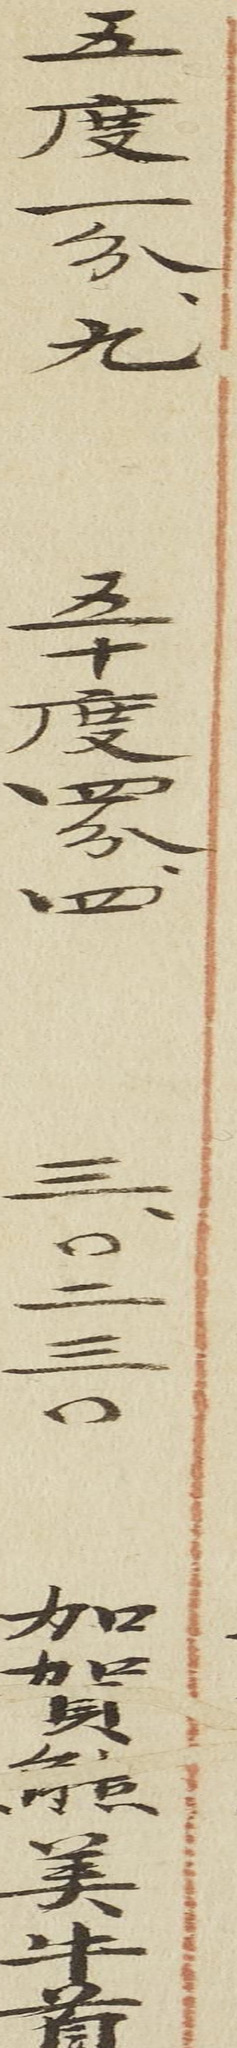五度一分、九五十度四分、四三、〇二三〇加賀熊美牛首
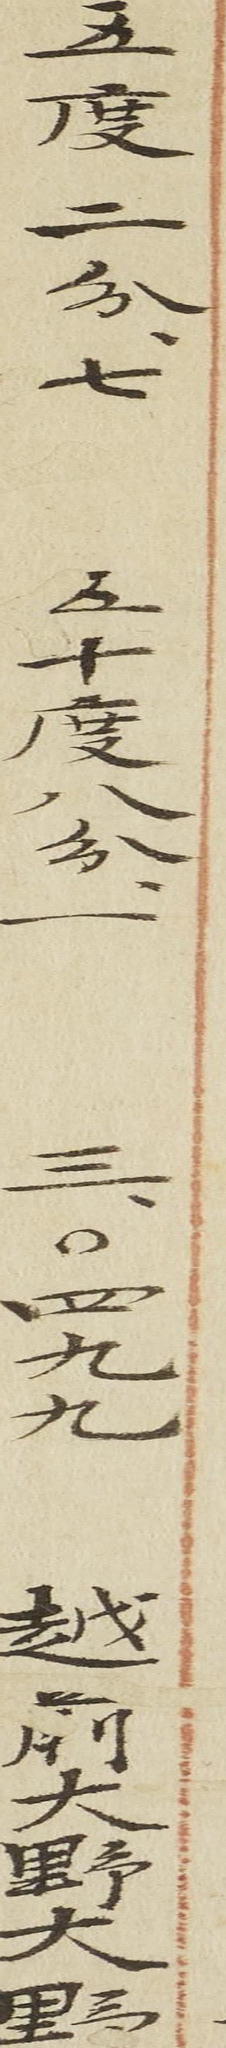五度二分、七五十度八分、一三、〇四九九越前大野大野
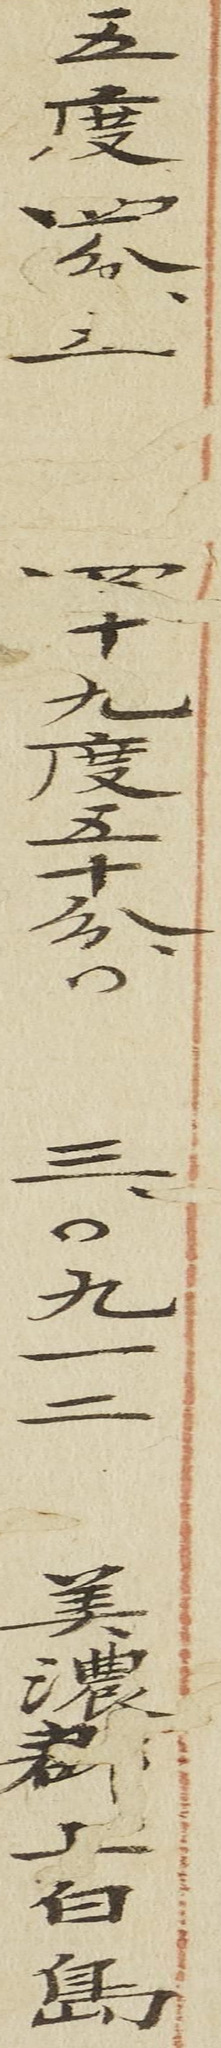五度四分、五四十九度五十分、〇三、〇九一二美濃郡上白島

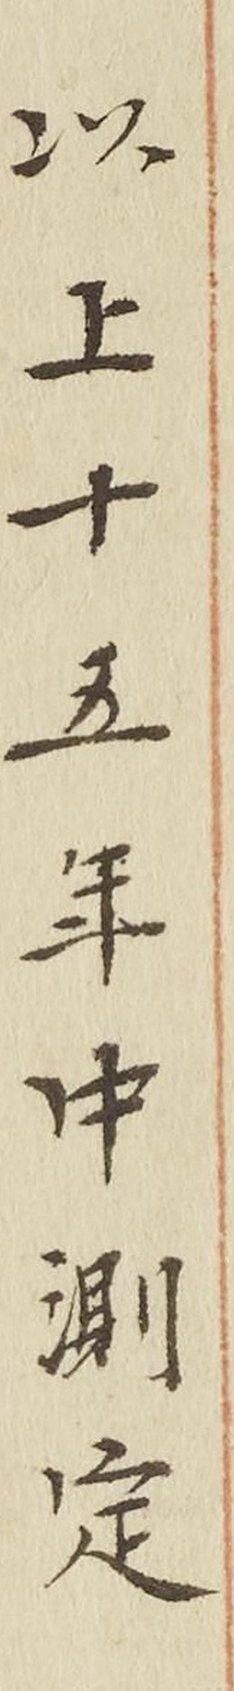以上十五年中測定
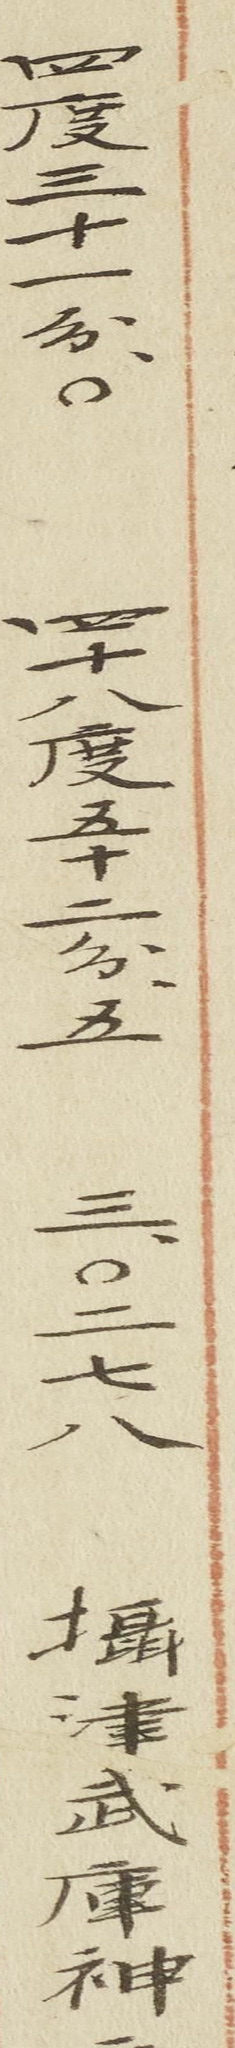四度三十一分、〇四十八度五十二分、五三、〇二七八摂津武庫神戸
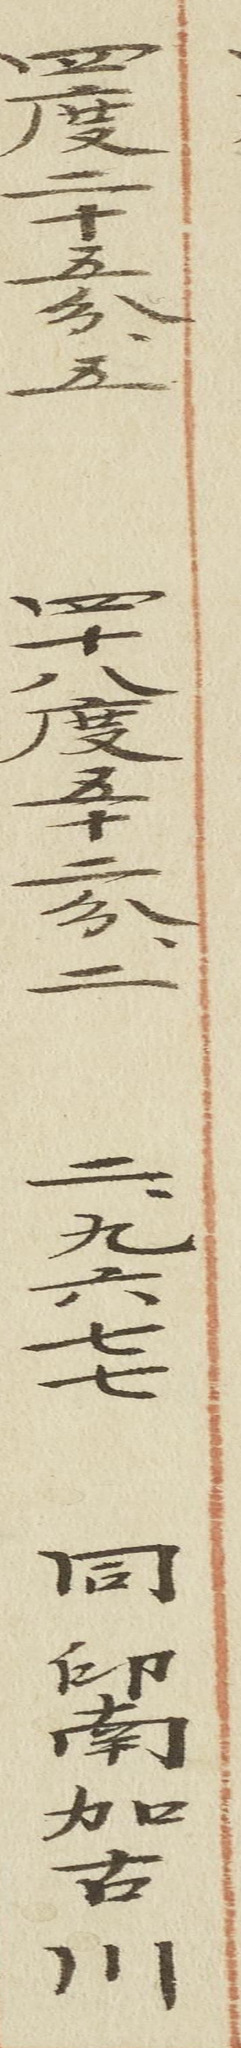四度二十五分、五四十八度五十二分、二二、九六七七同印南加古川
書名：鑷力観測報告
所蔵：東京大学地震研究所図書室 Earthquake Research Institute Library, The University of Tokyo, JAPAN
